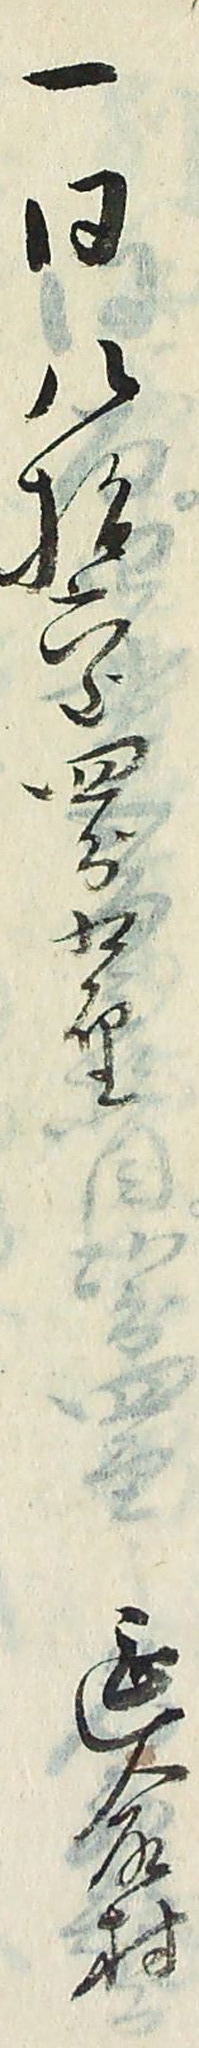一同八拾六匁四分九厘延命村
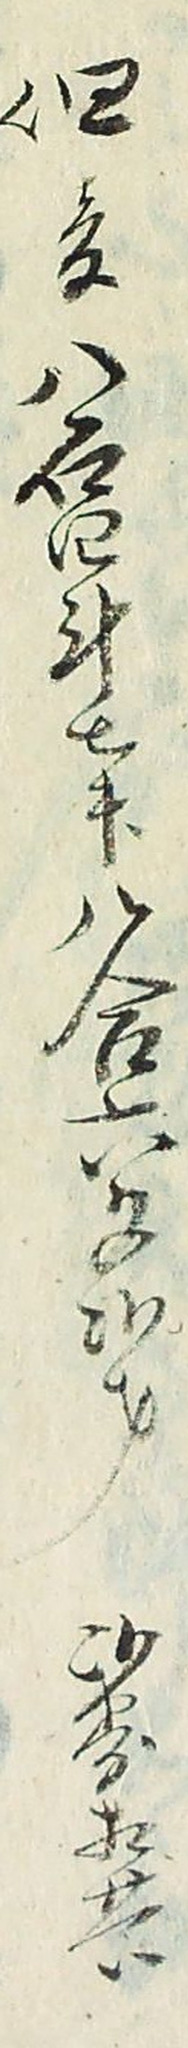但麦八石四斗七升八合六夕弐才弐歩相共
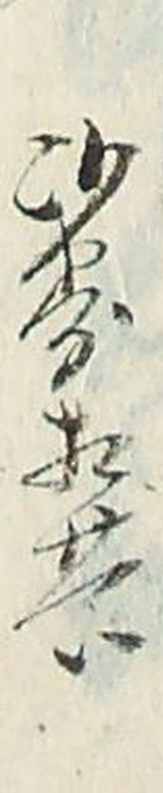弐歩相共
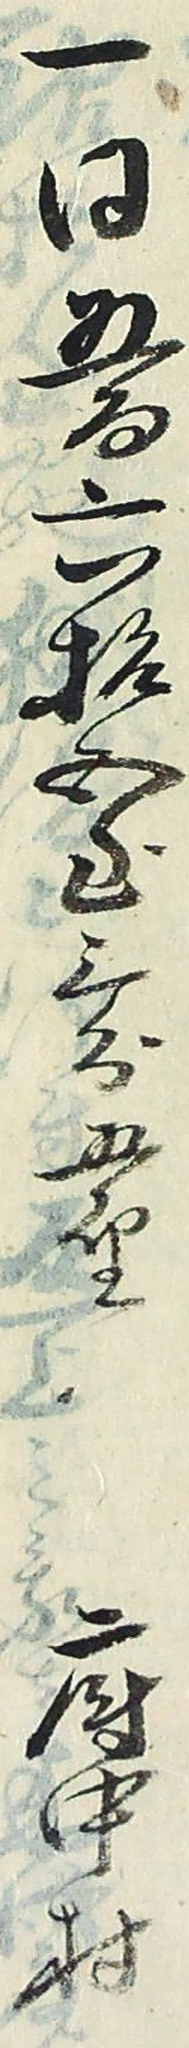一同五百六拾五匁三分五厘府中村
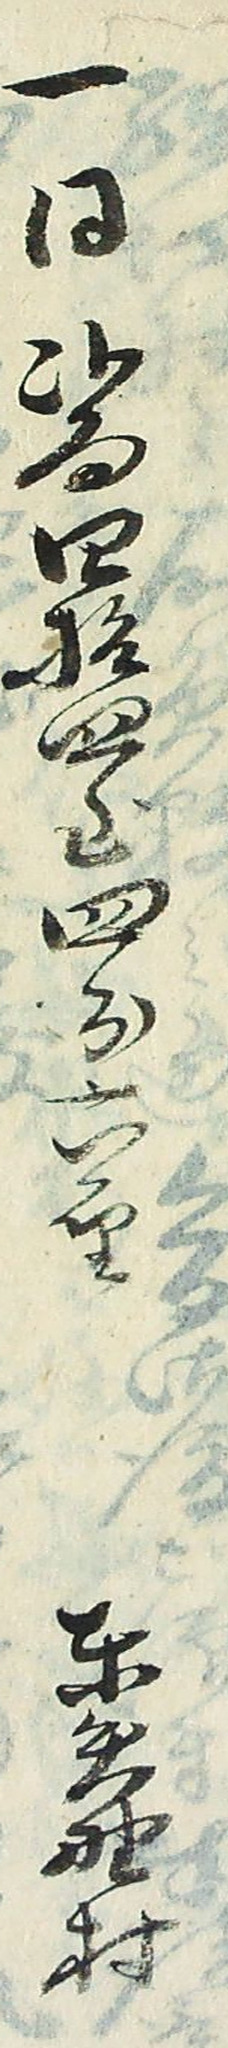一同弐百四拾四匁四分六厘東矢野村
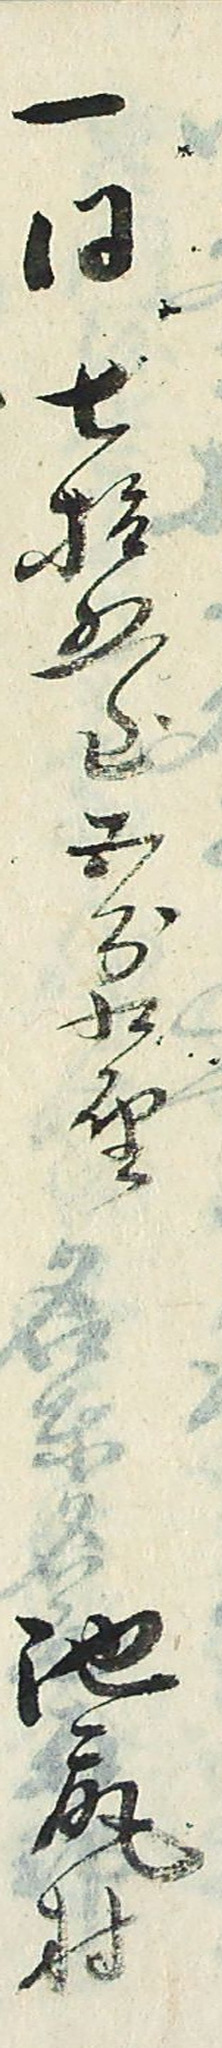一同七拾五匁五分九厘池尻村
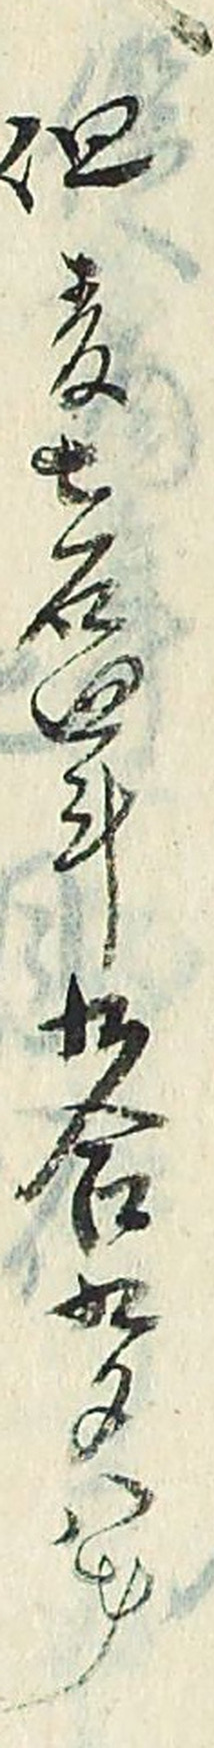但麦七石四斗九合九夕八才
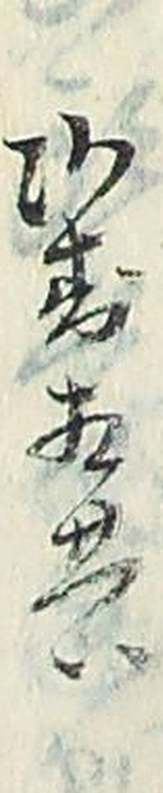弐歩相共
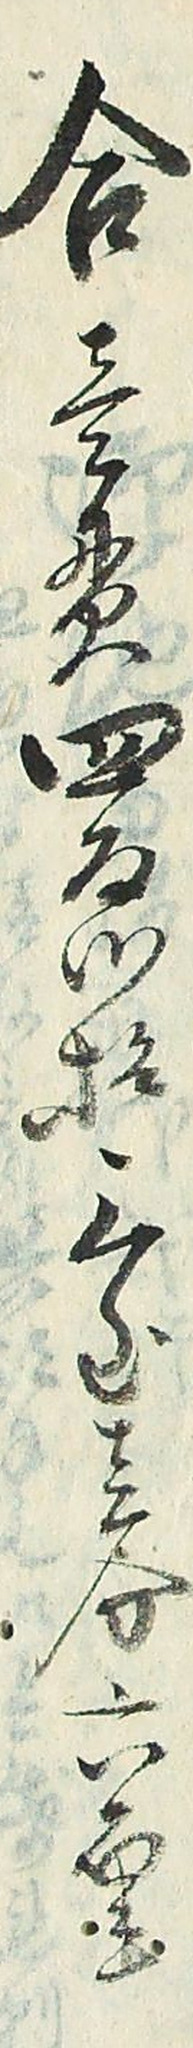合壱貫四百弐拾三匁壱分六厘

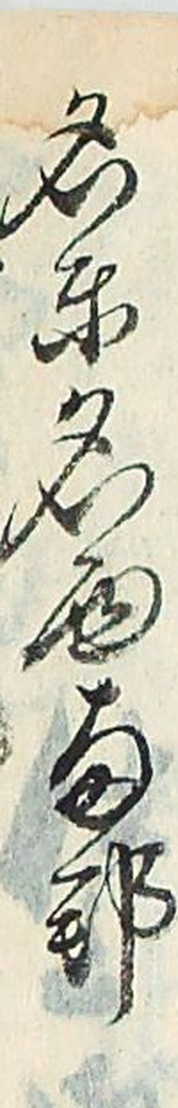名東名西両郡
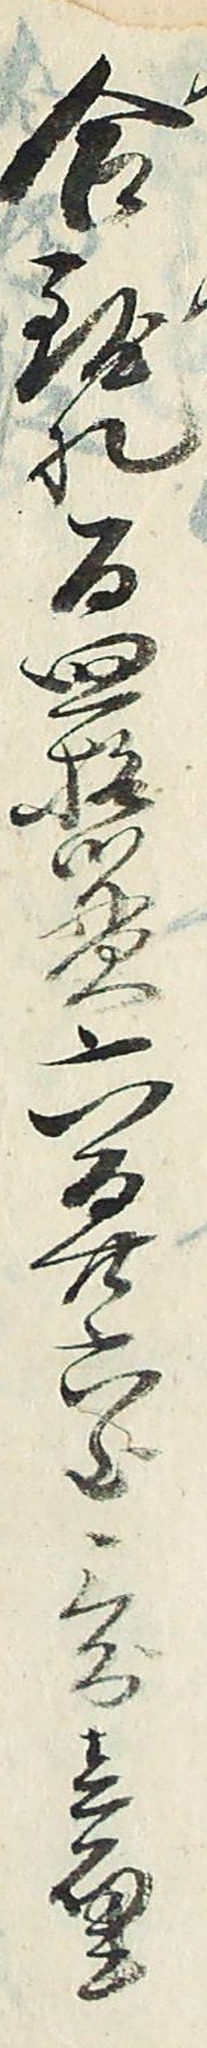合銀札百四拾弐貫六百廿六匁三分壱厘
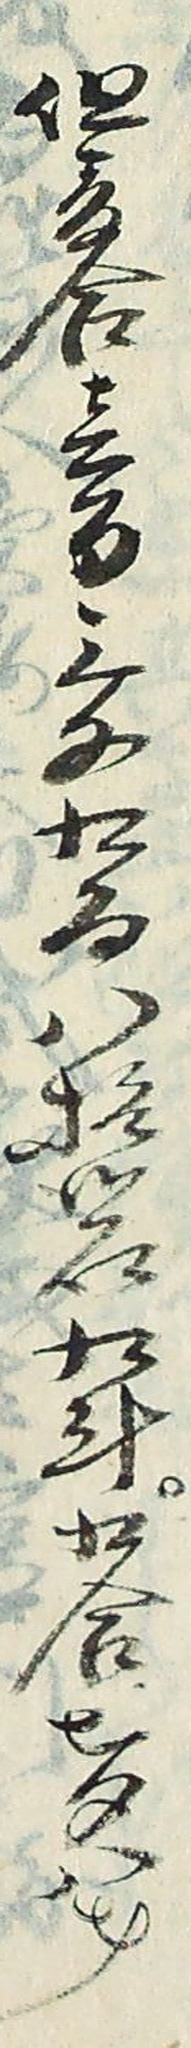但麦合壱万三千九百八拾弐石九斗九合七夕八才
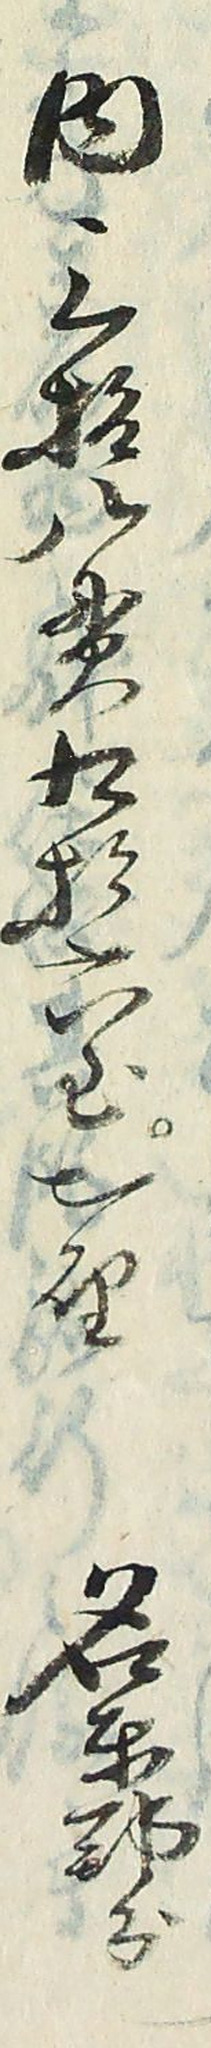内三拾八貫九拾六匁七厘名東郡分
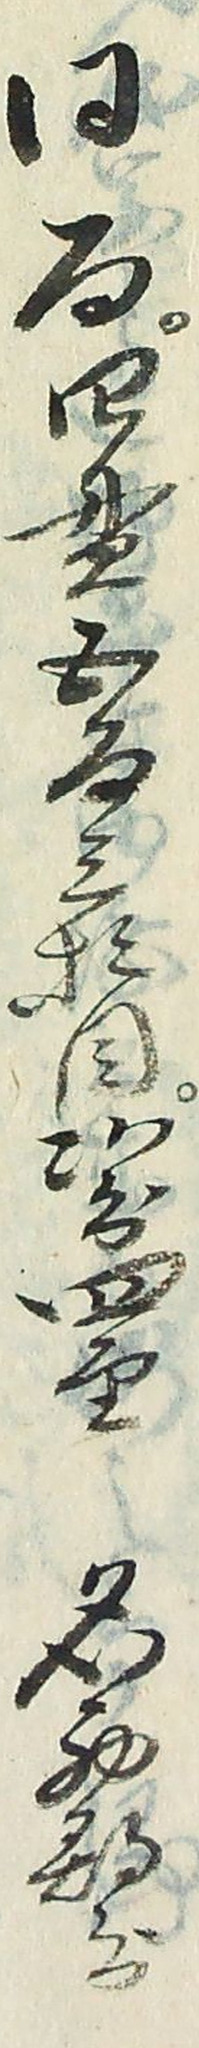同百四貫五百三拾目弐分四厘名西郡分
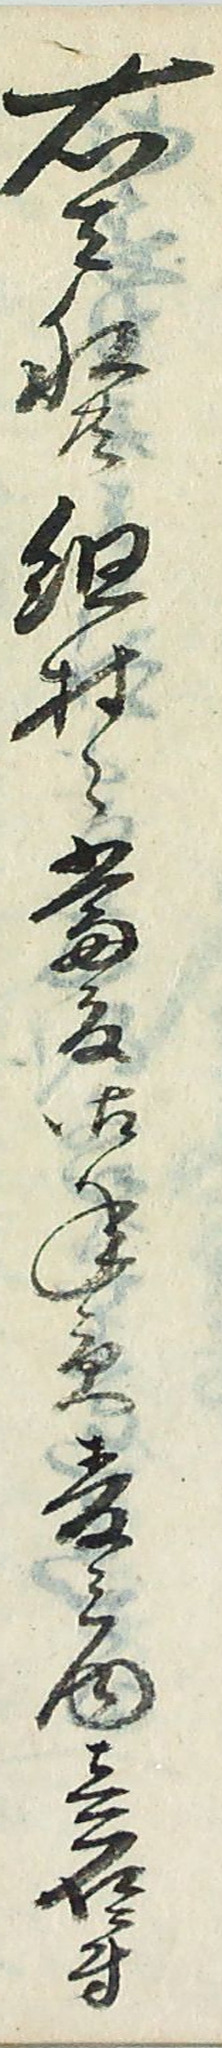右は私共組村々当夏御年貢麦之内壱石に付
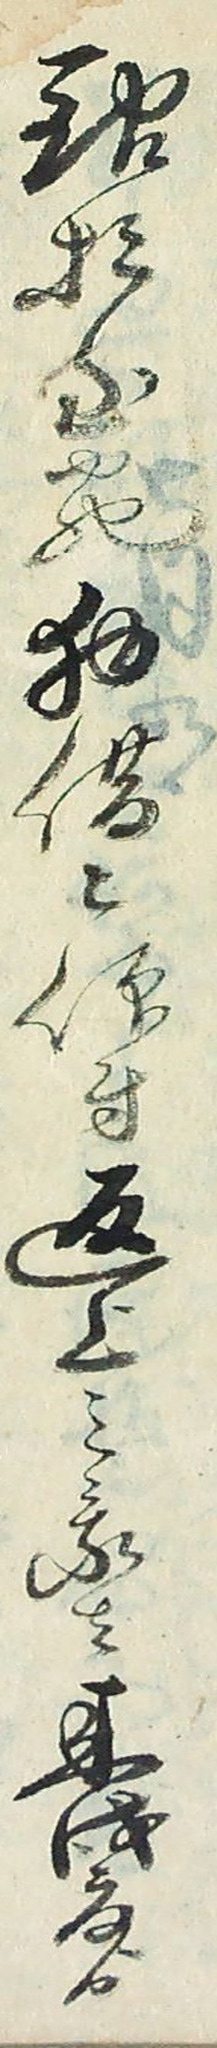銀拾匁宛拝借被仰付返上之義は来戌夏ゟ
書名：諸御用御□受書控
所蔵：鳴門教育大学 Naruto University of Education
